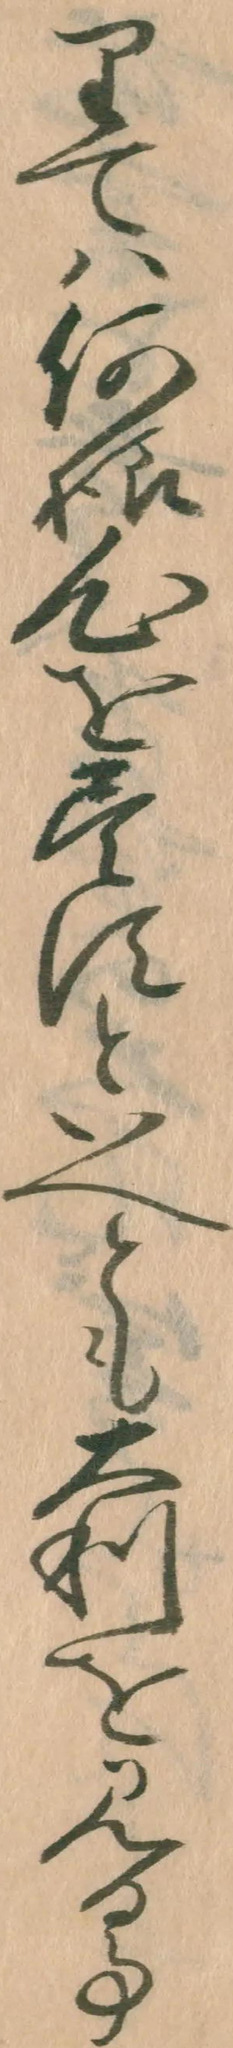りては何様心を尽すといへとも大利を見る事
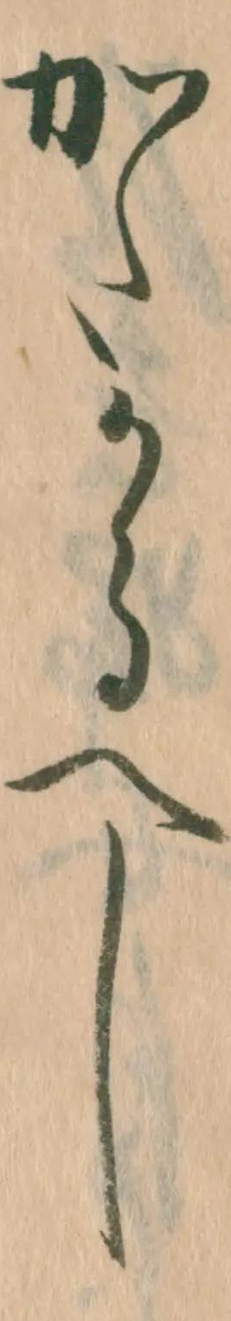かたかるへし
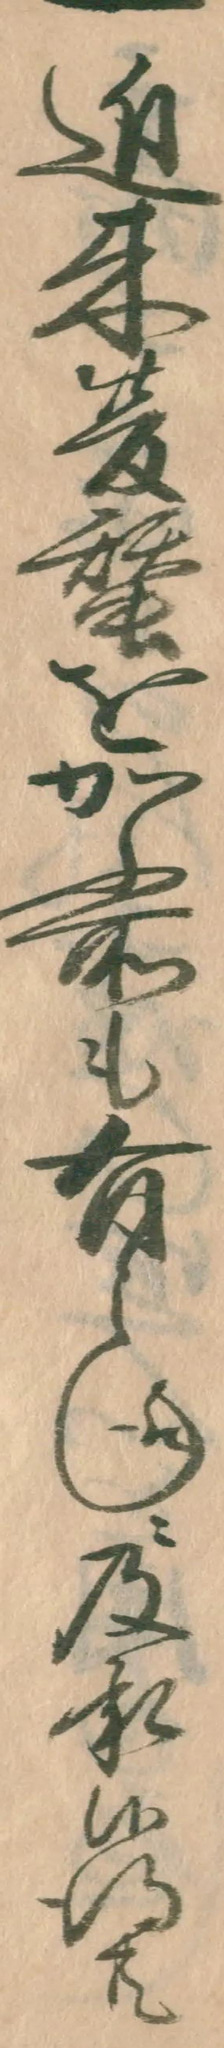一近来夏蚕をかふ所も有之趣に及承候得共
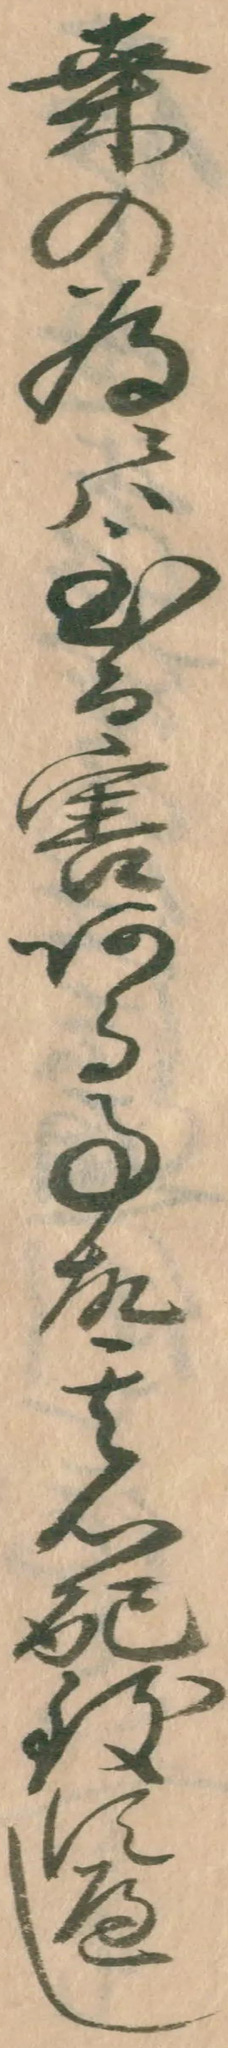桑の為には至て害ある事故其心配致すへし
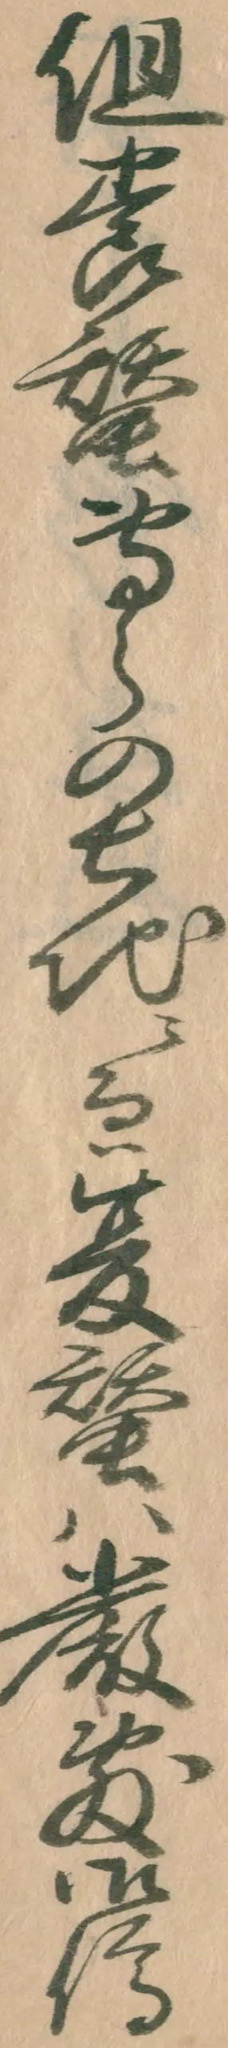但養蚕専らの土地にては夏蚕は厳敷御停

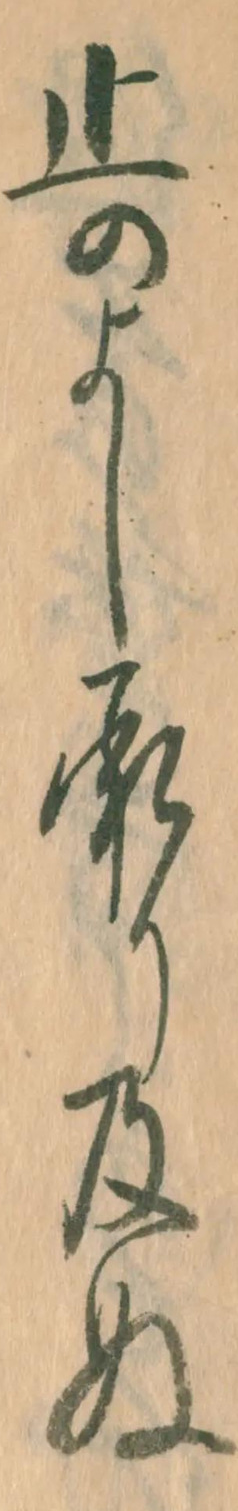止のよし承り及ぬ
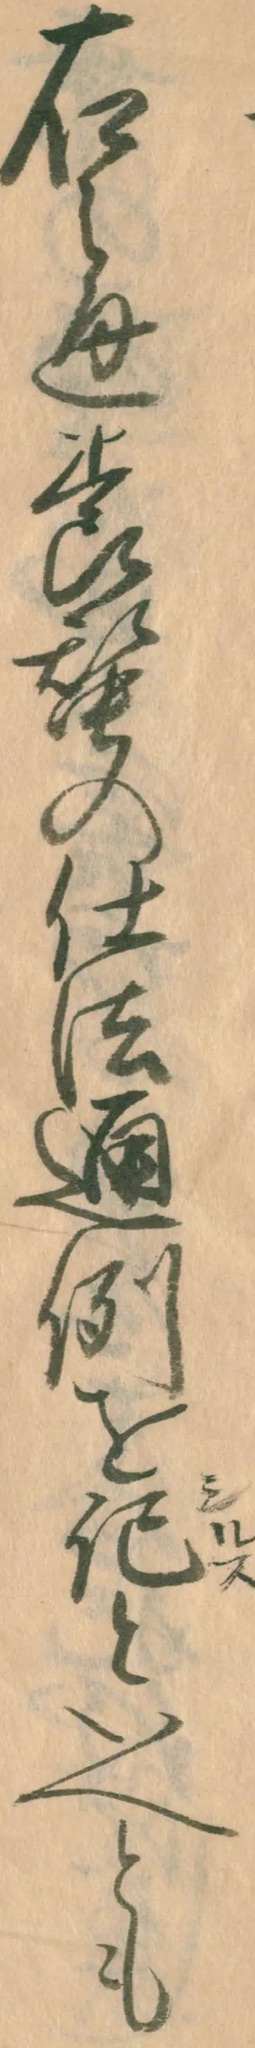右之通養蚕の仕法通例を記といへとも
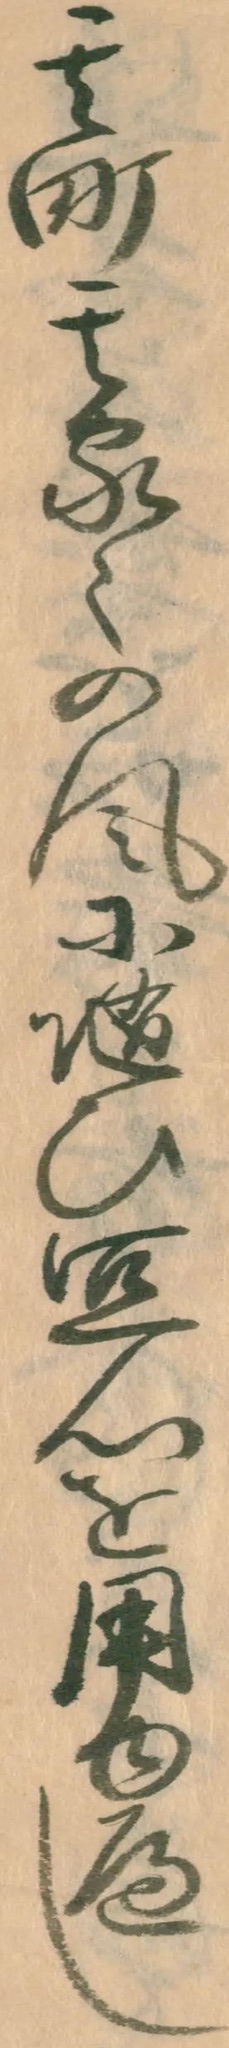其町其家々の風に随ひ宜心を用ゆへし
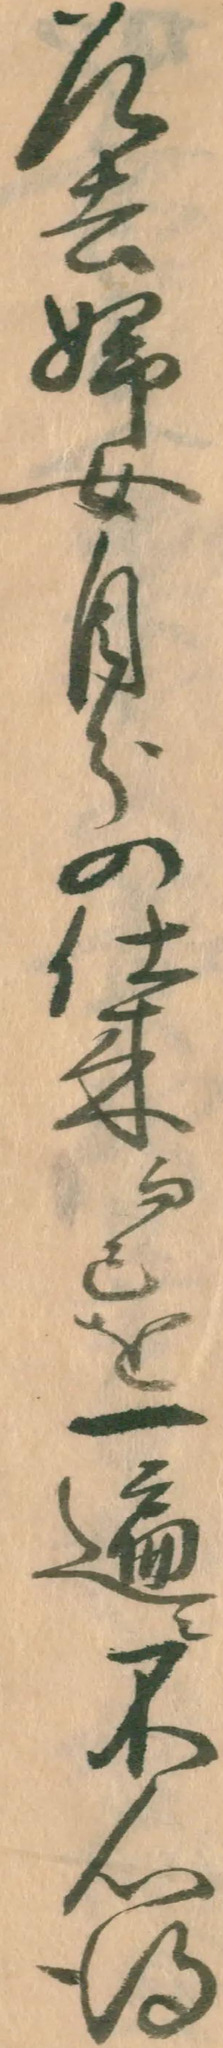乍去婦女自分の仕来而已を一遍に不心得
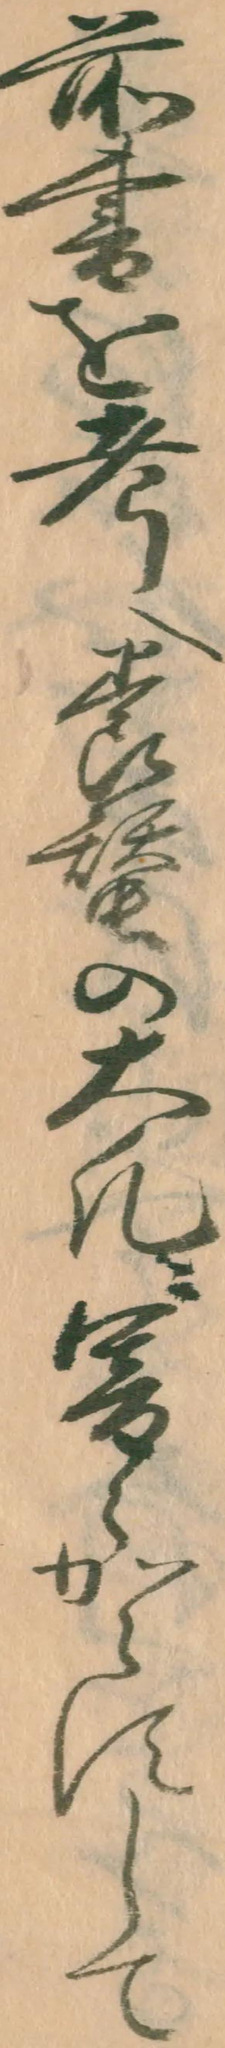前書を考へ養蚕の大凡に闇らからすして
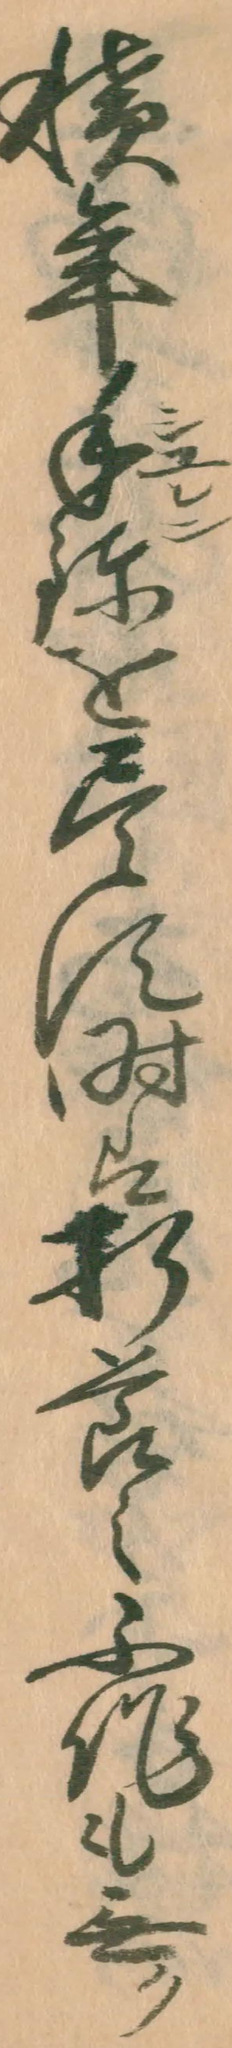積年手練を尽す時は折節之不作も無く
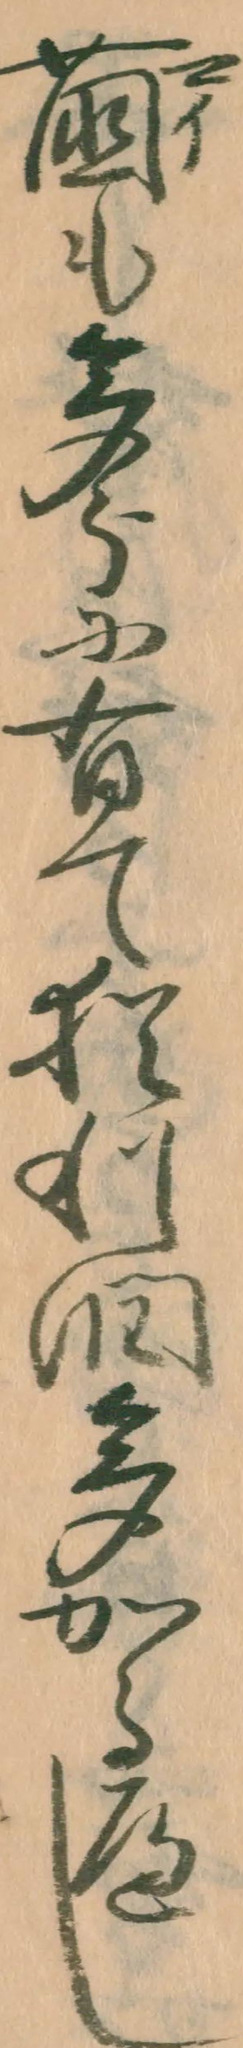繭も多分に有て猶利潤多かるへし
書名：養蚕録
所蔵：国立国会図書館 National Diet Library, JAPAN
